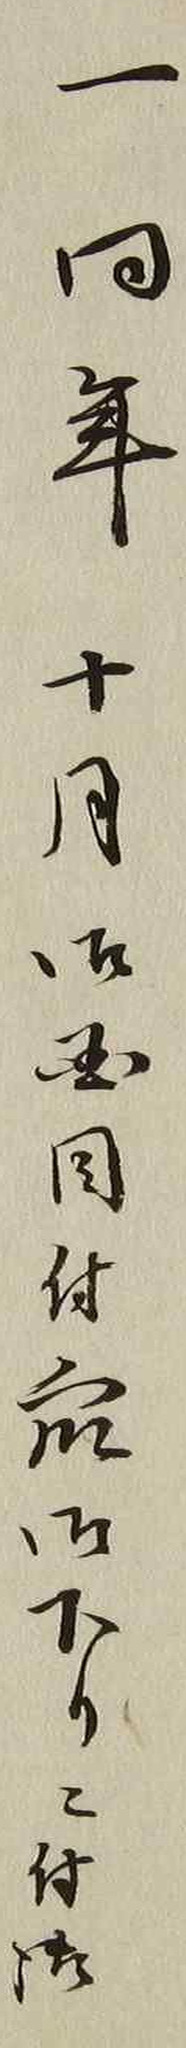一同年十月御国目付衆御下りニ付き御
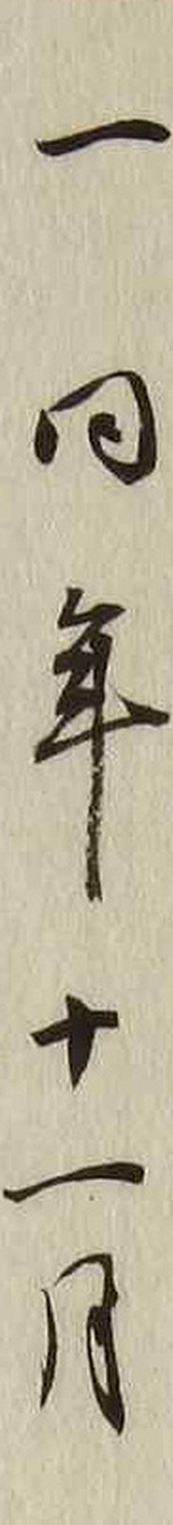一同年十一月

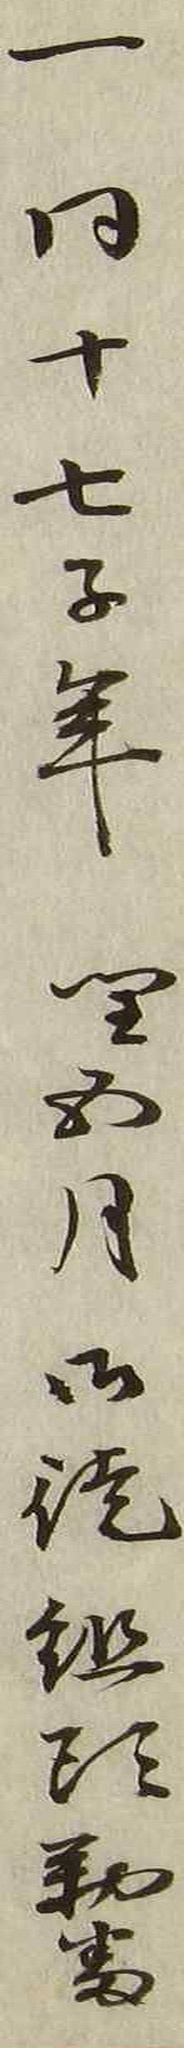一同十七子年閏五月御徒組頭勤番
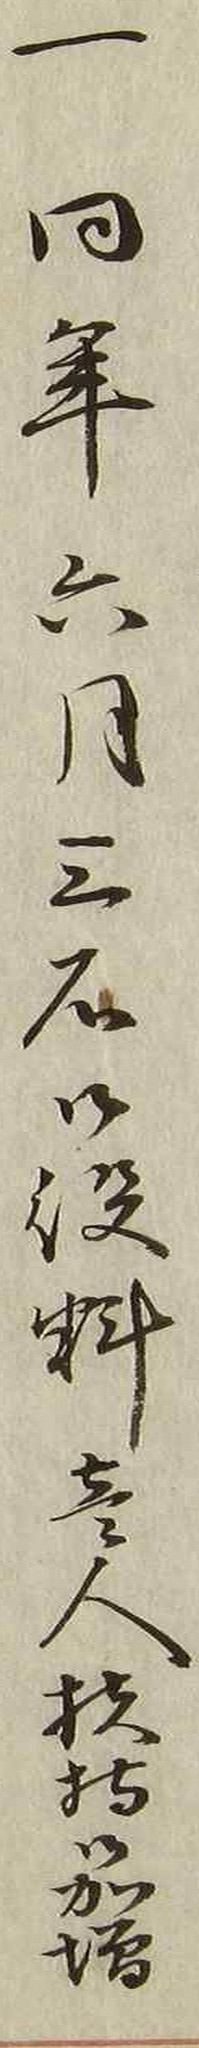一同年六月三石御役料壱人扶持御加増
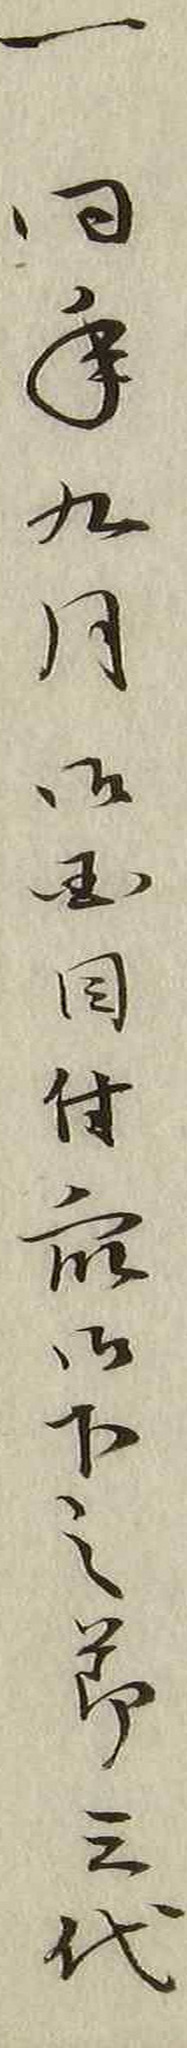一同年九月御国目付衆御下り之節三代
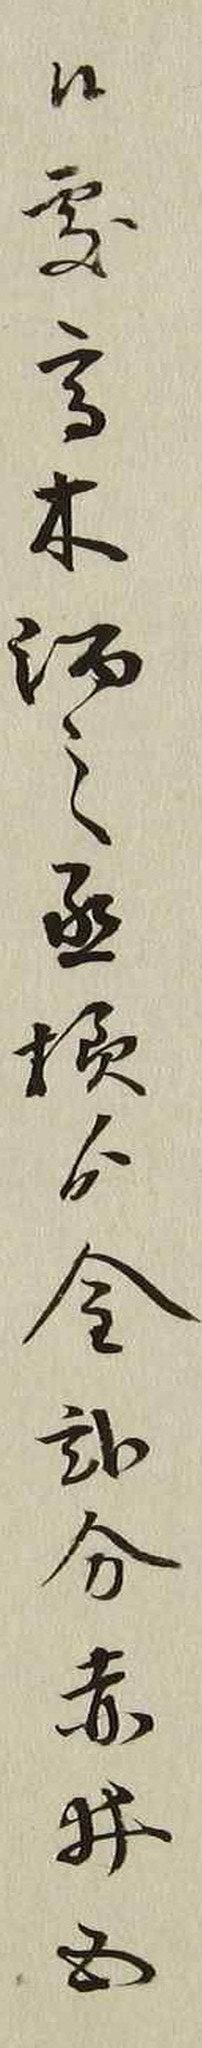候処高木酒之丞様より金弐分赤井五
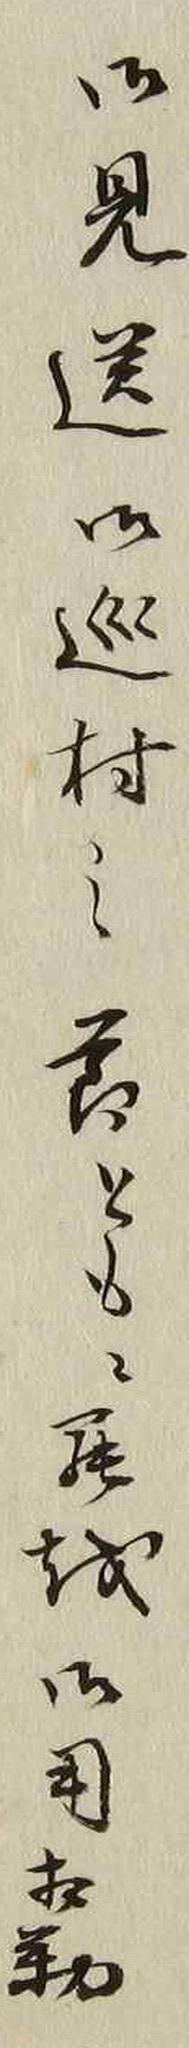御見送り御巡村之節ともニ罷り越御用相勤め
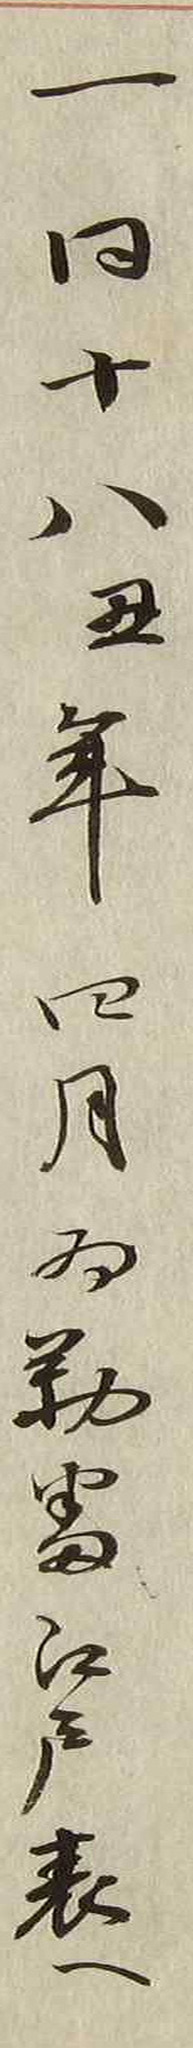一同十八丑年四月勤番之為江戸表へ
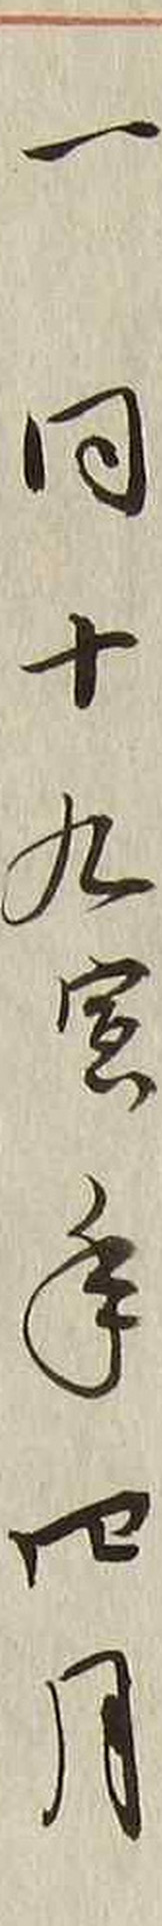一同十九寅年四月
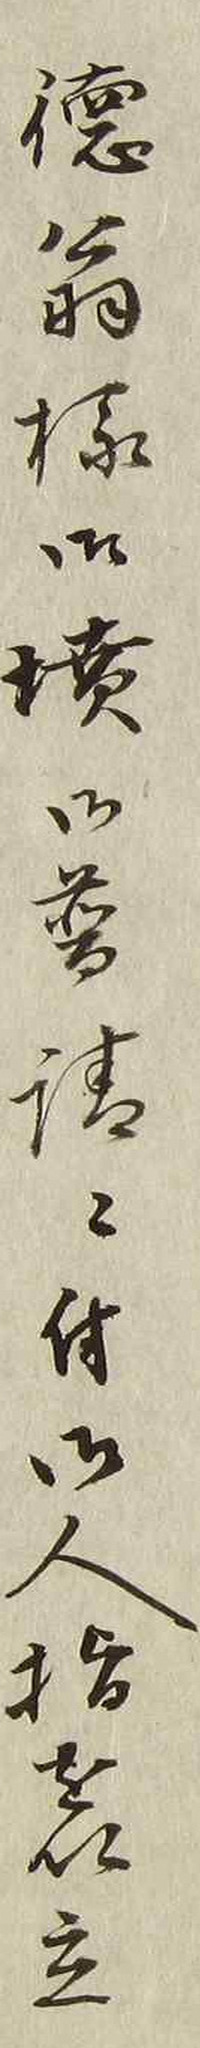徳翁様御墳御普請ニ付き御人指しを以立

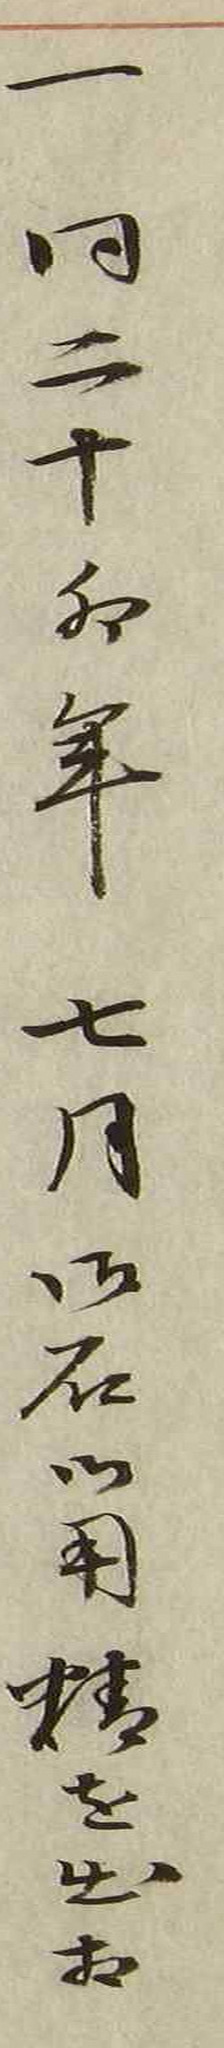一同二十卯年七月御石御用精出し相
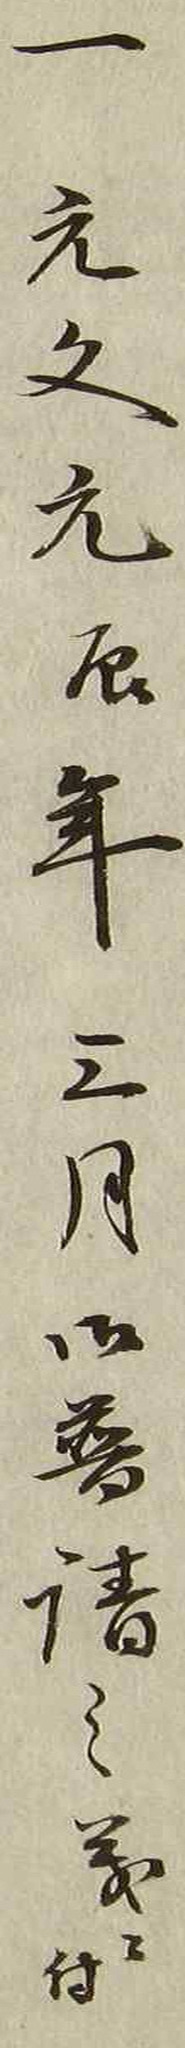一原文元辰年三月御普請之義ニ付き
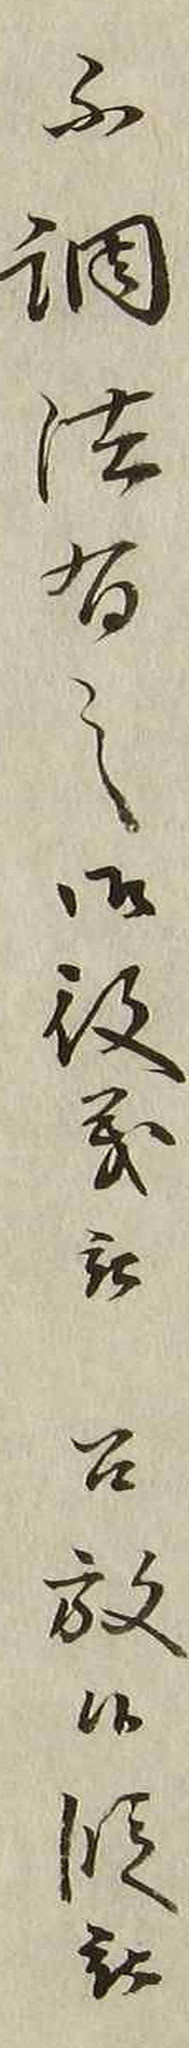不調法有之御役義召し放され候段
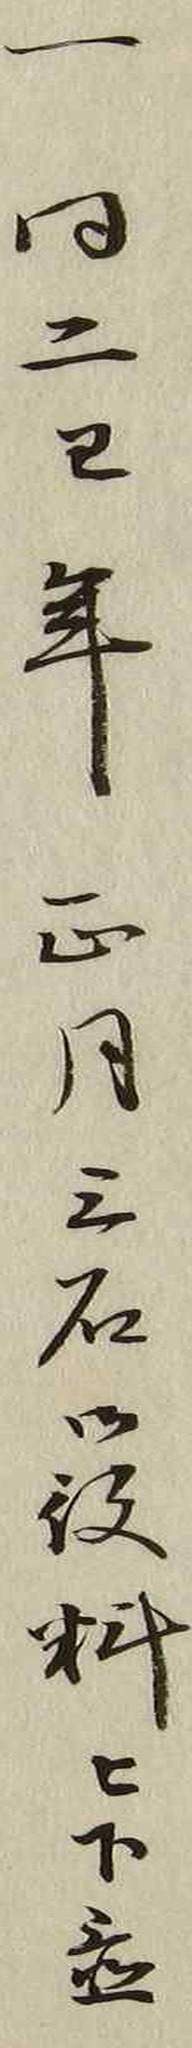一同二巳年正月三石御役料下し置かれ
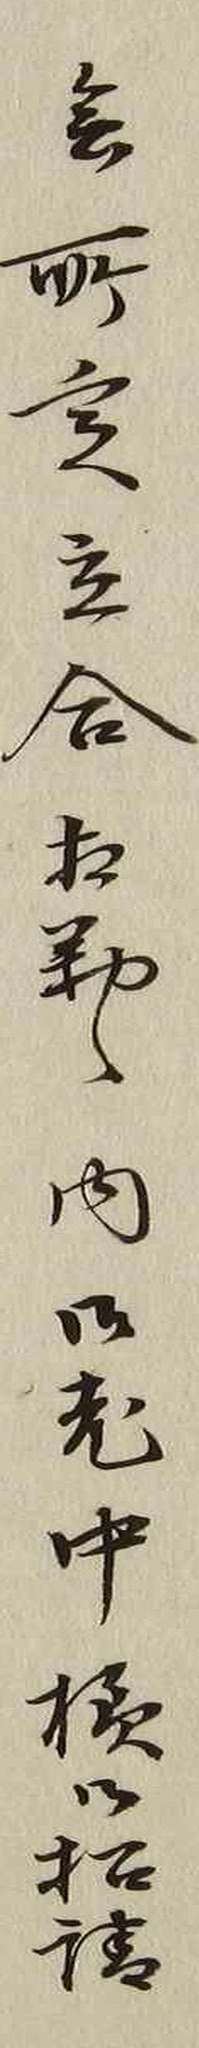会所寔立会相勤め候内御老中様御招情
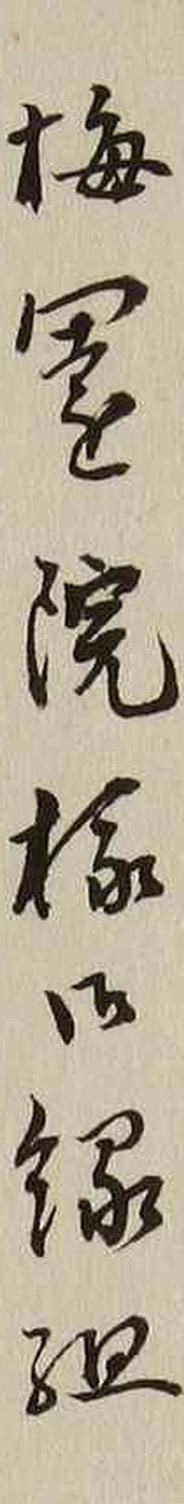梅園院様御縁組
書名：諸士系譜　巻之16　い之部16
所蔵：会津若松市立会津図書館
